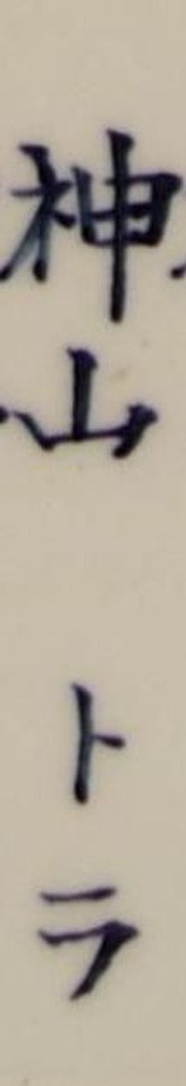神山トラ
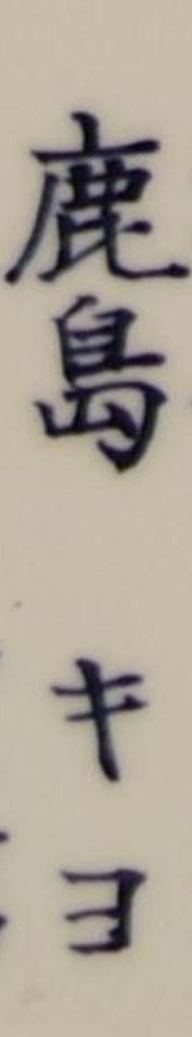鹿島キヨ
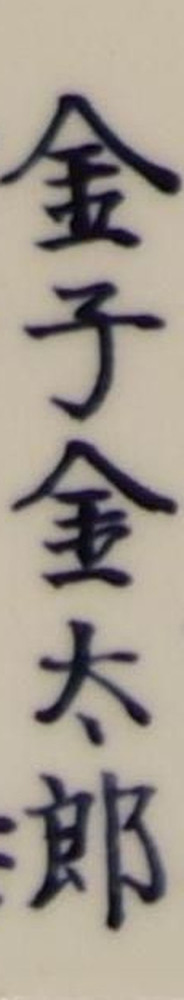金子金太郎
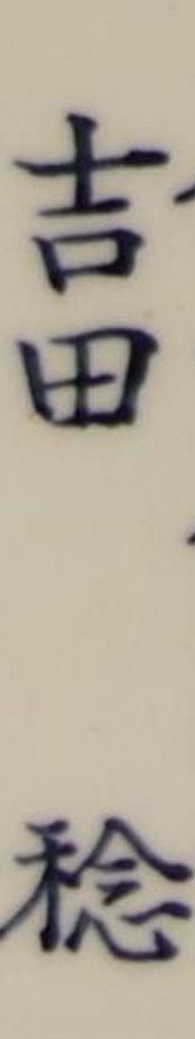吉田稔
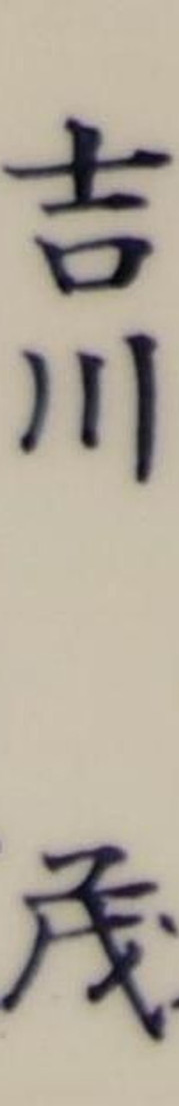吉川茂
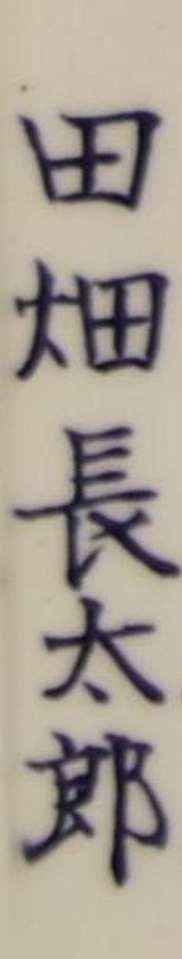田畑長太郎

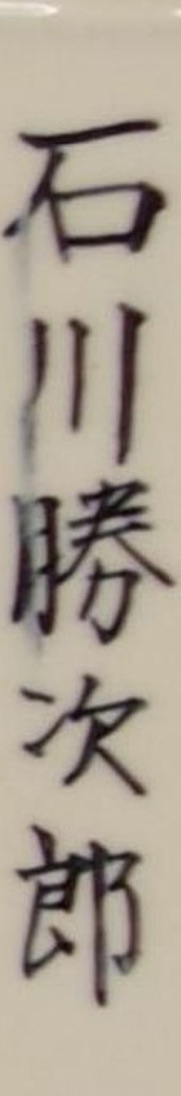石川勝次郎
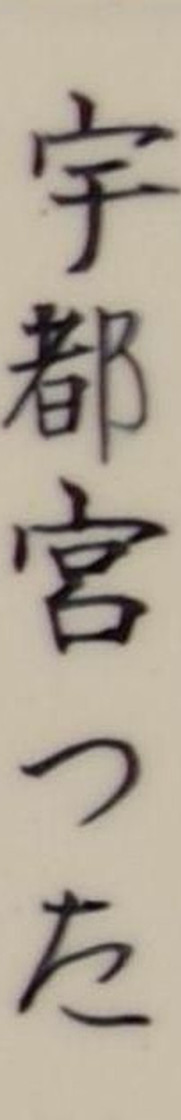宇都宮つた
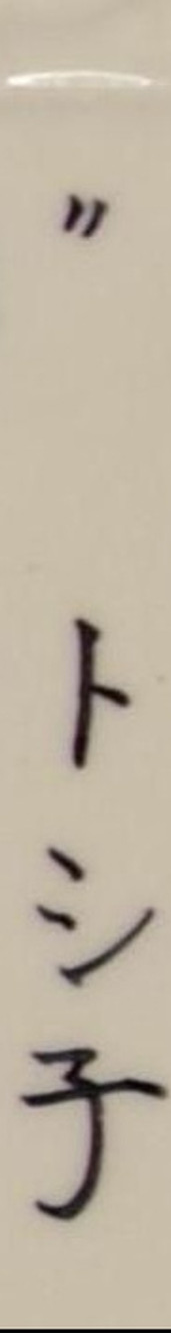トシ子
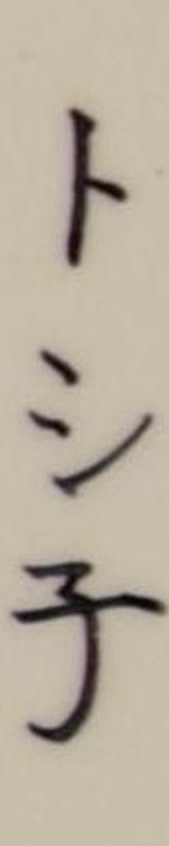トシ子
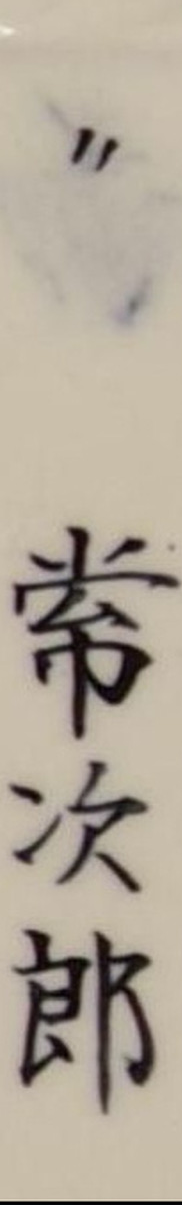常次郎
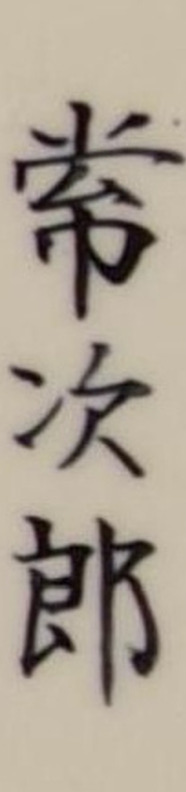常次郎
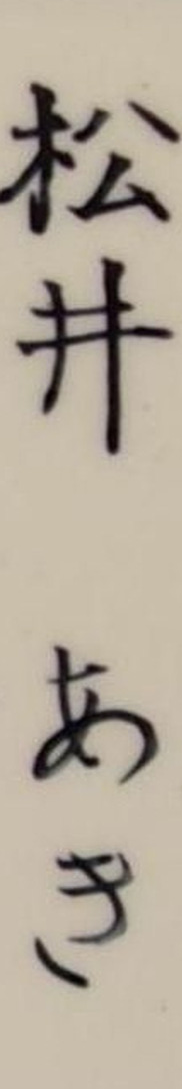松井あき
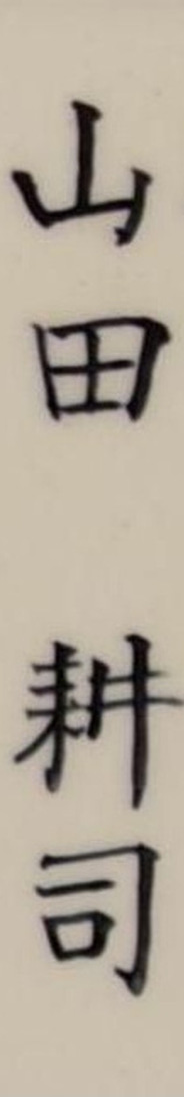山田耕司
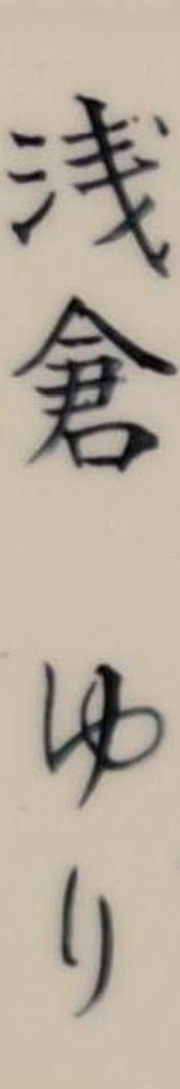浅倉ゆり
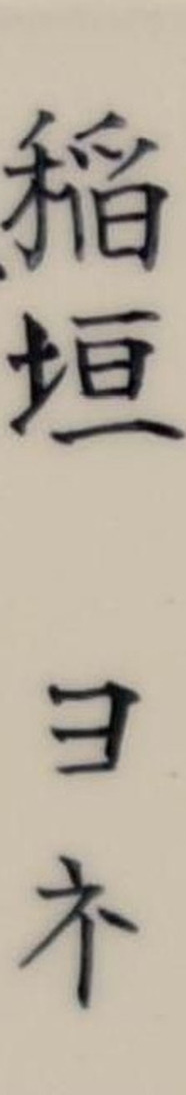稲垣ヨネ
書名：M~S
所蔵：高野山金剛峯寺
